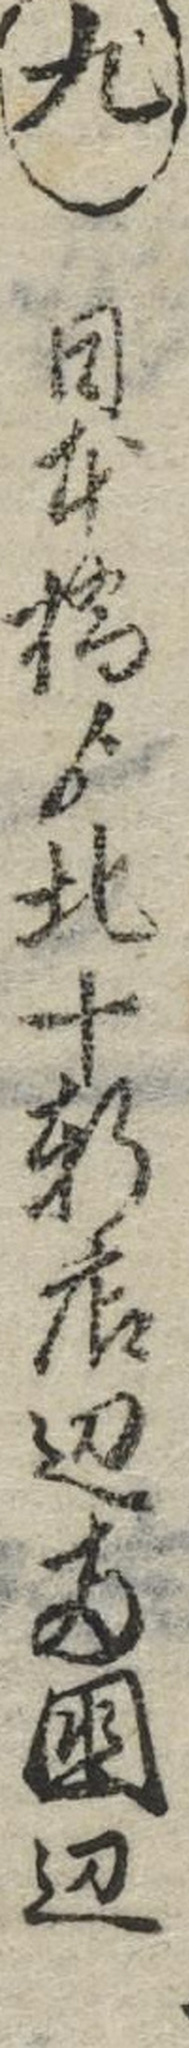九日本橋ゟ北十軒店辺両国辺
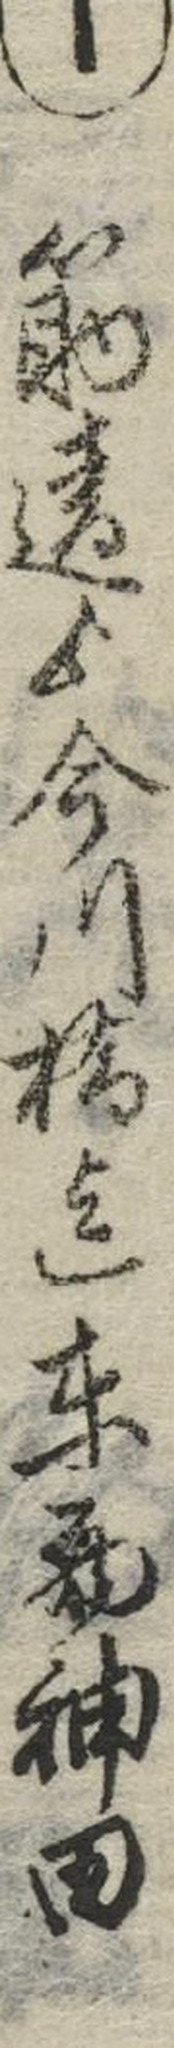十筋違ゟ今川橋迄東西神田
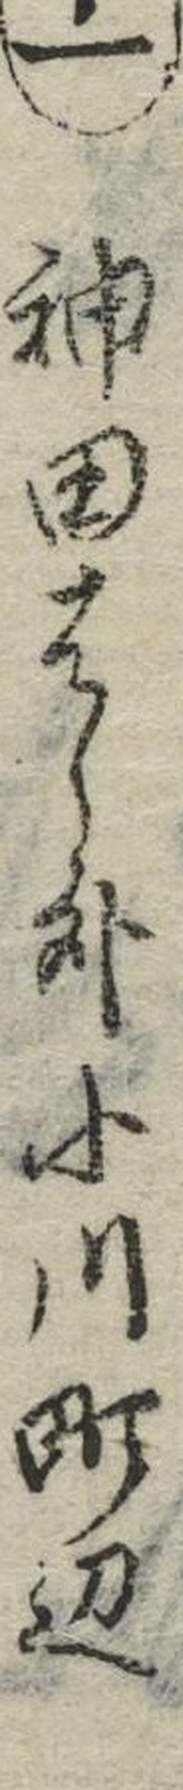十一神田はし外小川町辺
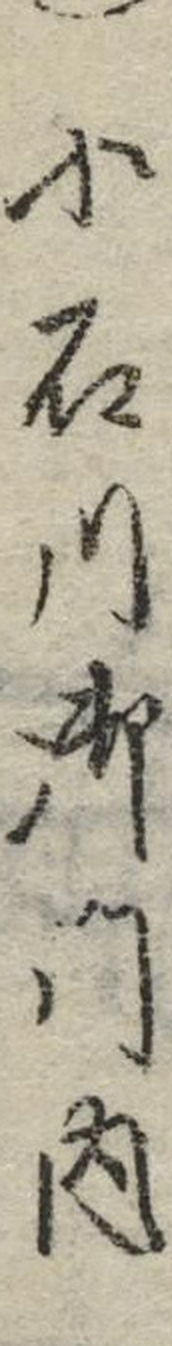十二小石川御門内
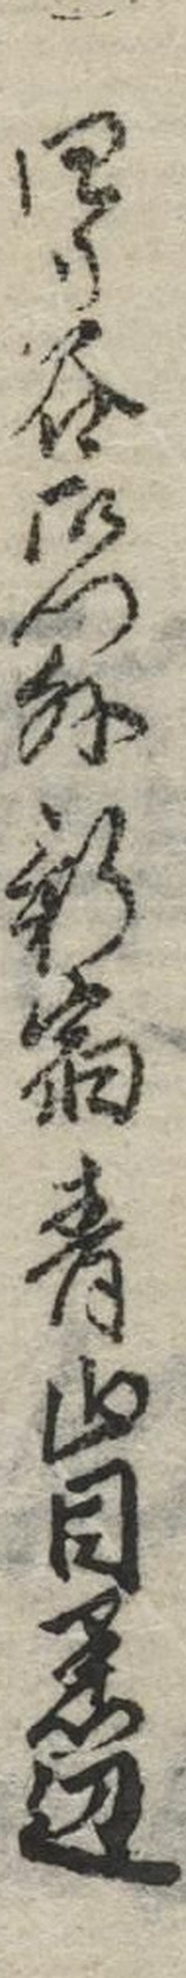十四四ツ谷御門外新宿青山目黒辺
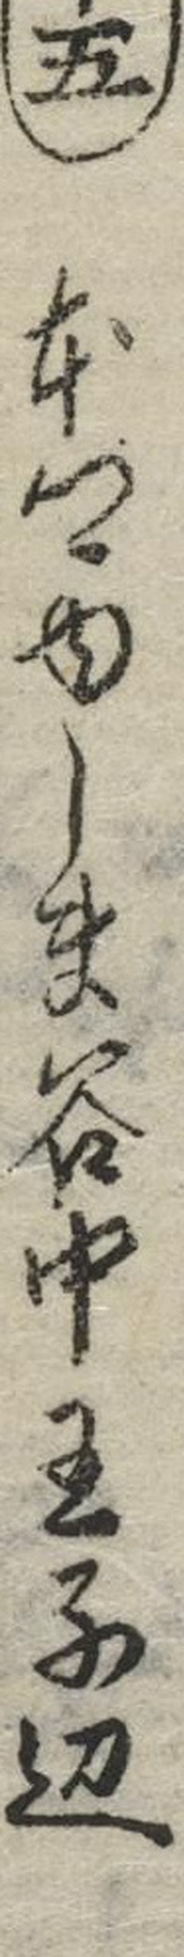十五本郷ゆしま谷中王子辺
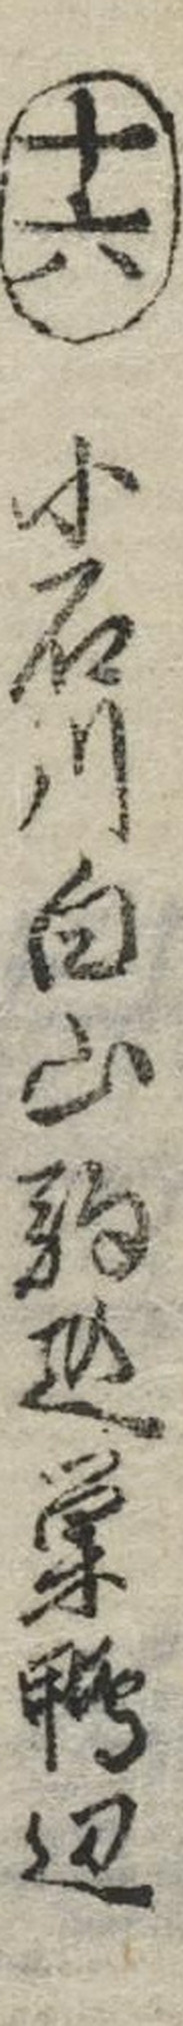十六小石川白山駒込巣鴨辺
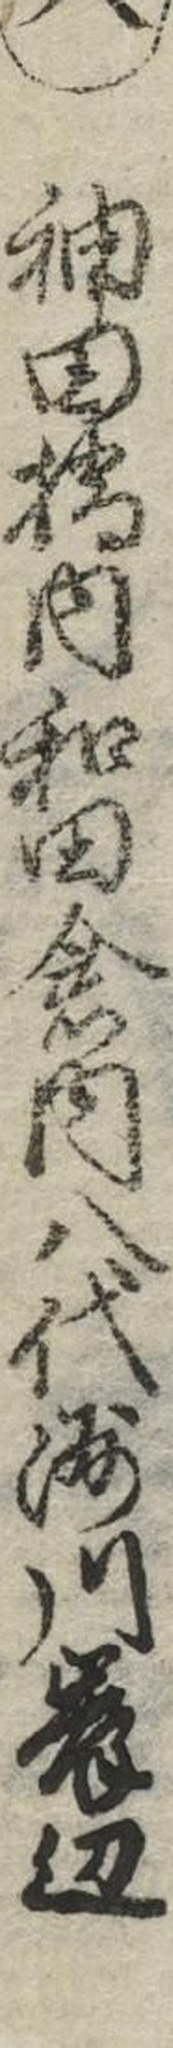十八神田橋内和田倉門矢八代洲川岸辺
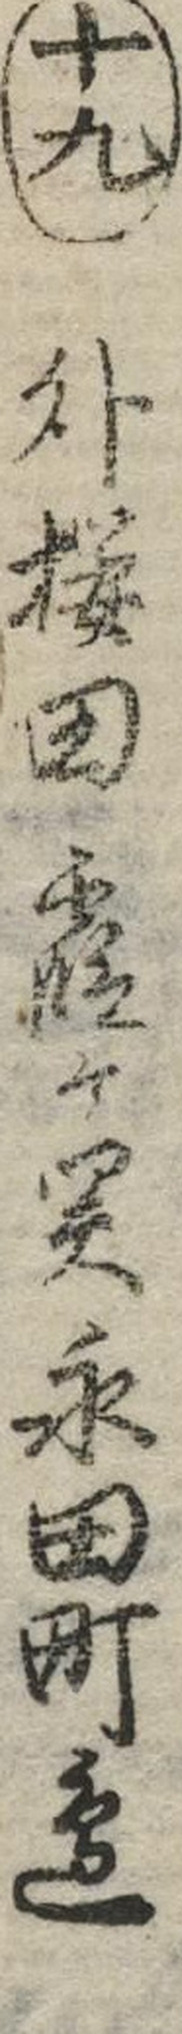十九外桜田霞ケ関永田町辺
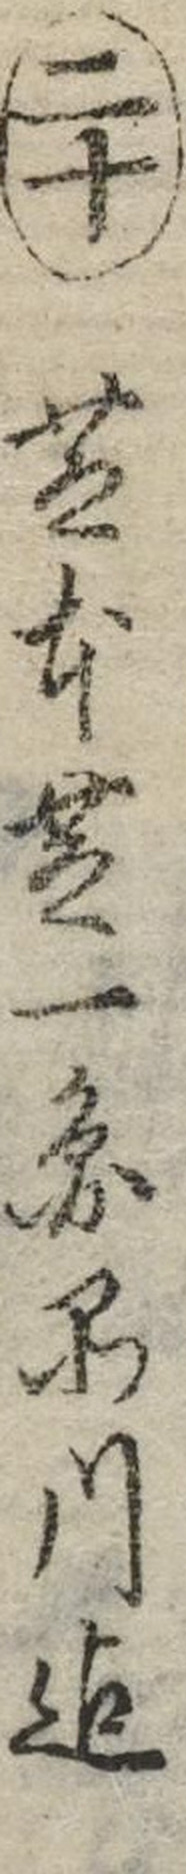二十芝本芝一円品川迄
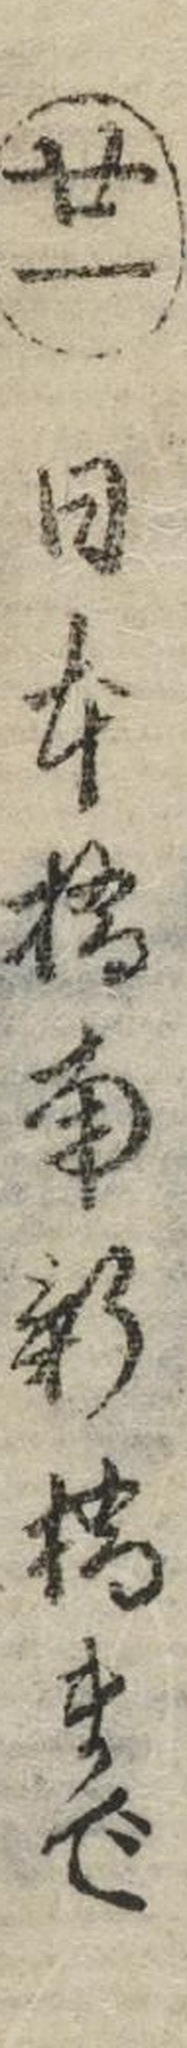廿一日本橋南新橋まで
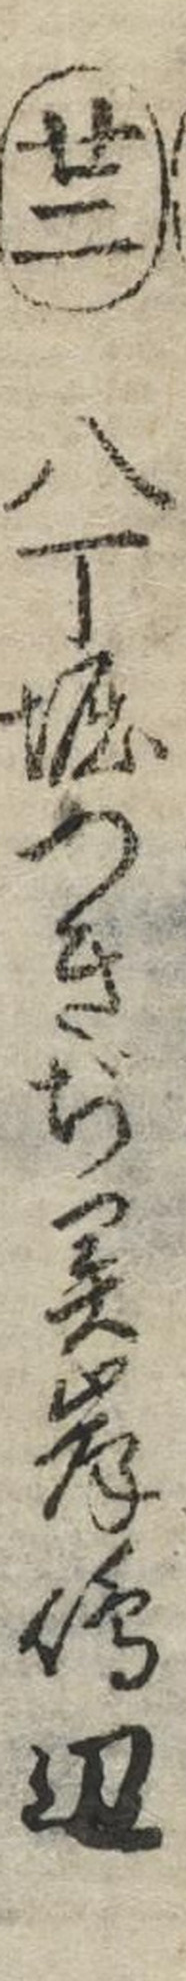廿二八丁堀つきぢ霊岸嶋辺
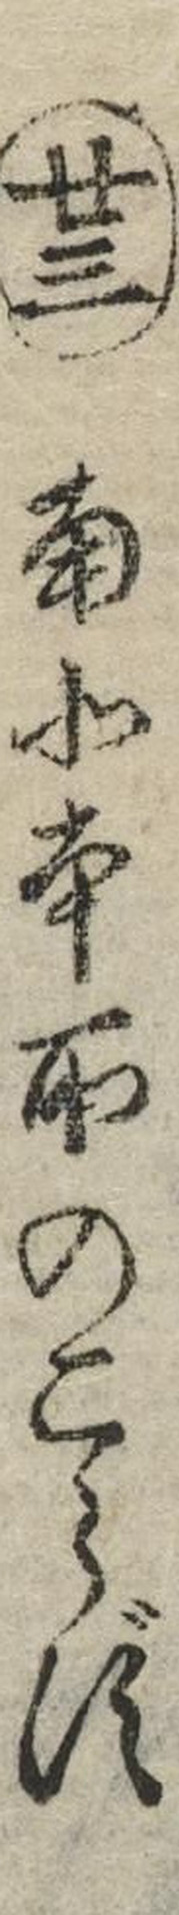廿三南北本所のこらず
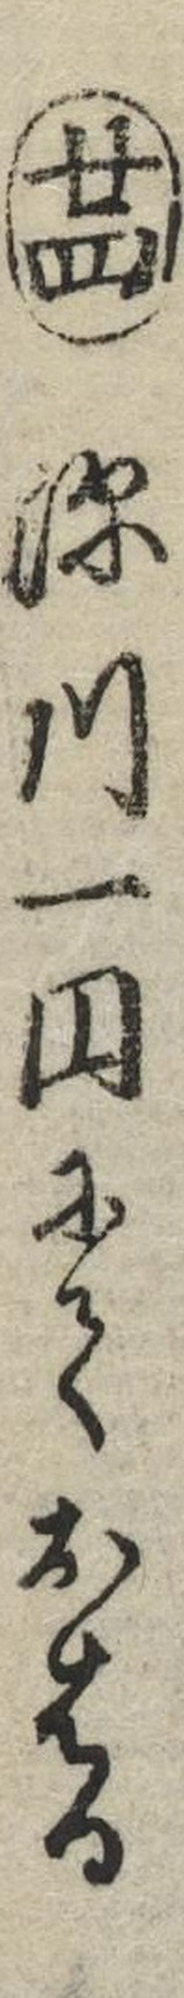廿四深川一円にておはる
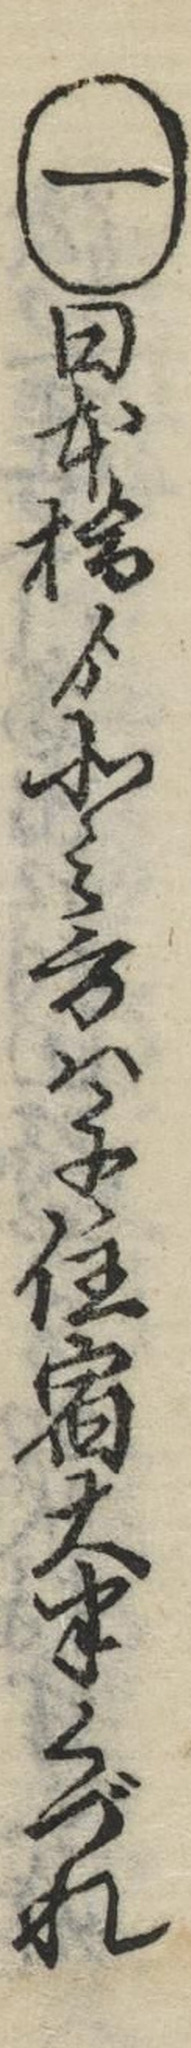一日本橋ゟ北之方ハ千住宿大半くづれ
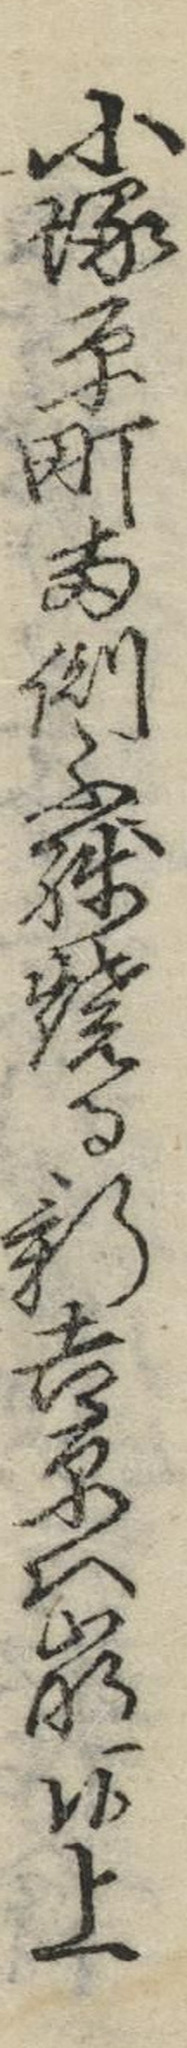小塚原町両側不残焼る新吉原ハ崩候上
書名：江戸御屋鋪方町方共　地震類焼場所巨細書之寫　潰家潰土蔵共取調附街道筋近在迄
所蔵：東京大学地震研究所図書室 Earthquake Research Institute Library, The University of Tokyo, JAPAN
